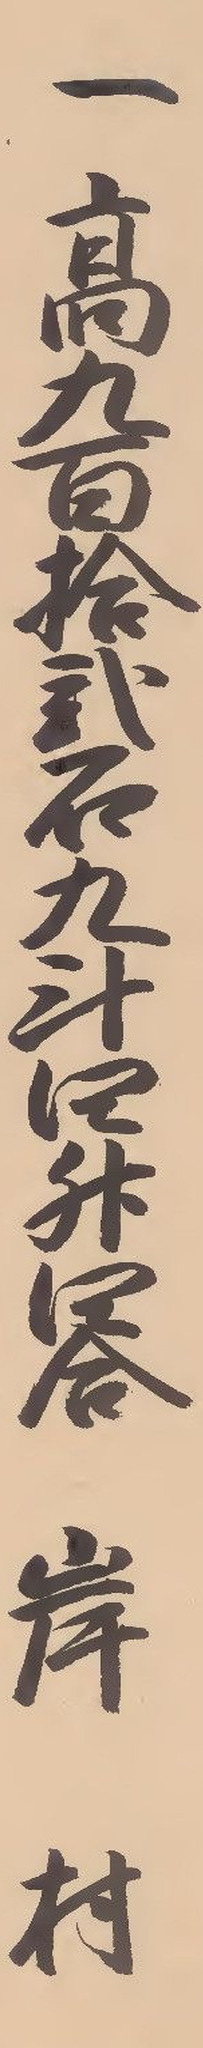一高九百拾弐石九斗四升四合岸村
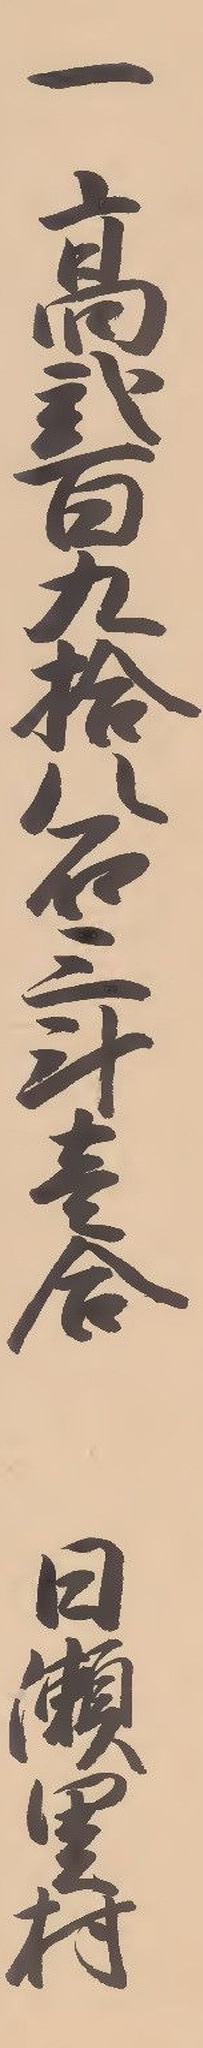一高弐百九拾八石三斗壱合日瀬里村
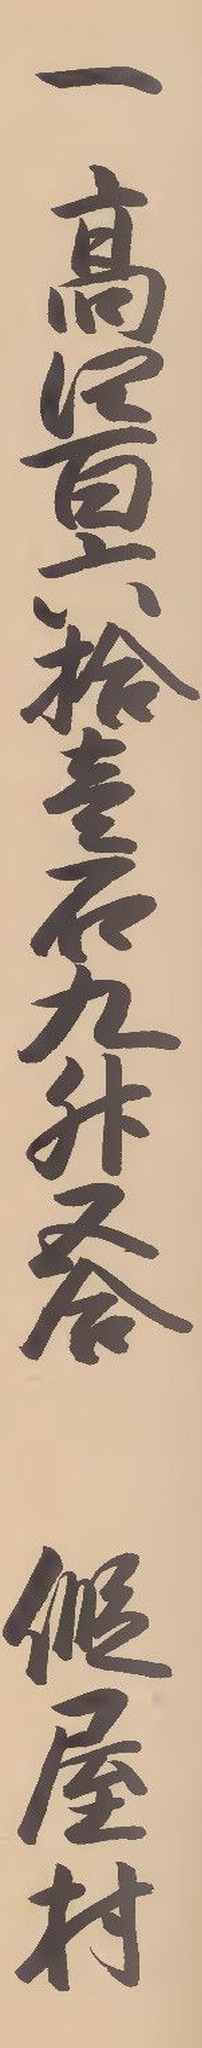一高四百六拾壱石九升五合仮屋村
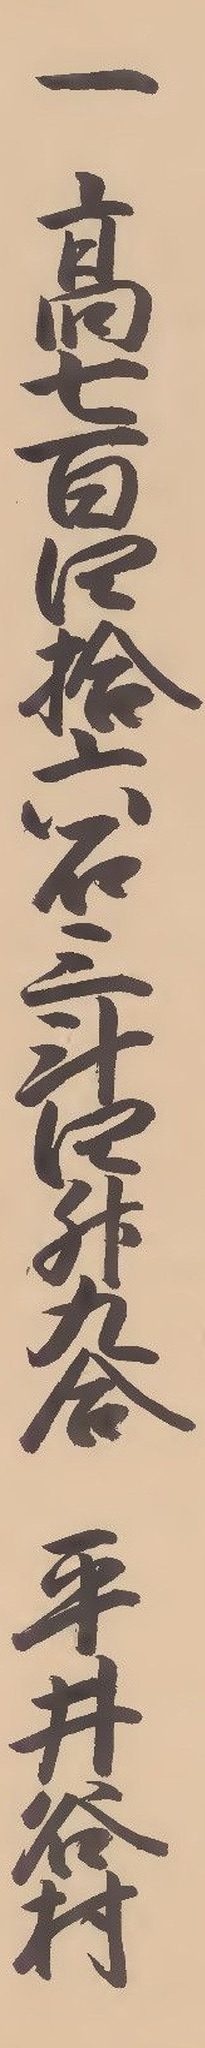一高七百四拾六石三斗四升九合平井谷村
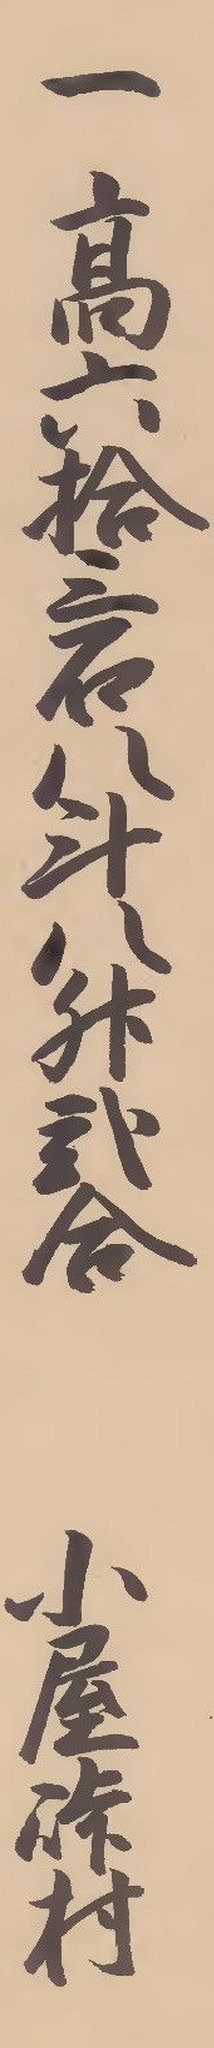一高六拾三石八斗八升弐合小屋峠村
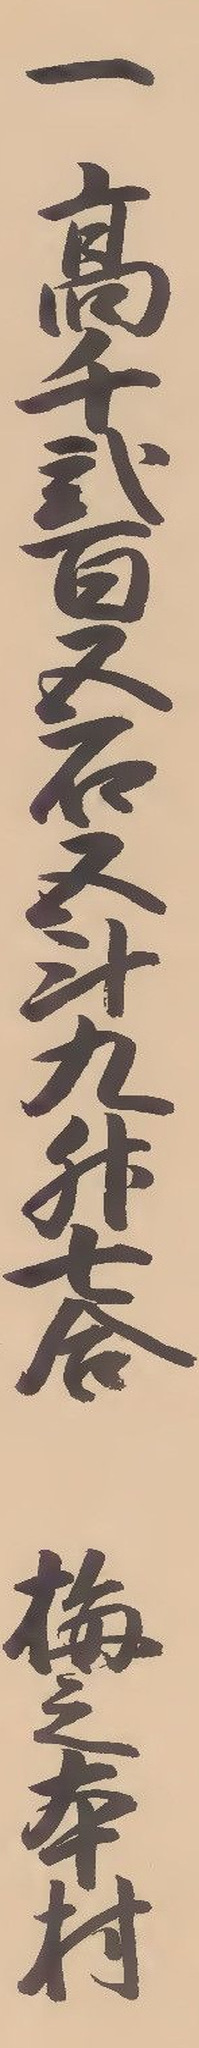一高千弐百五石五斗九升七合梅之本村

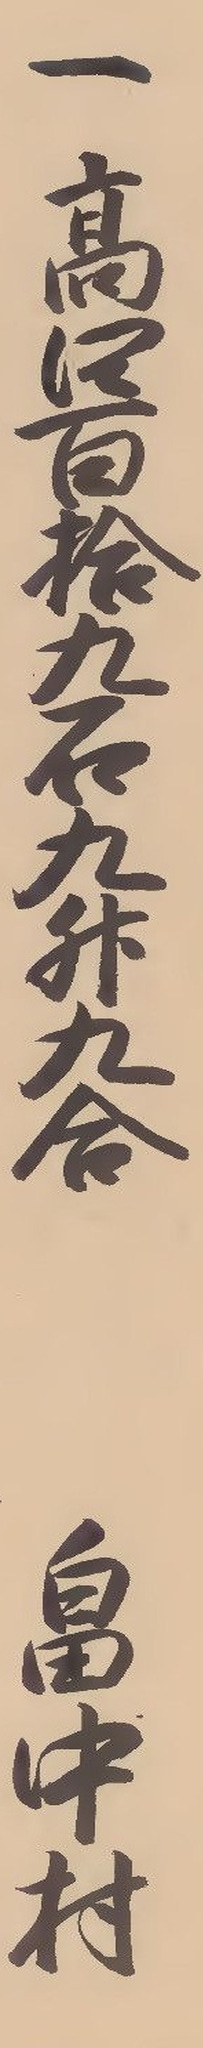一高四百拾九石九升九合畠中村
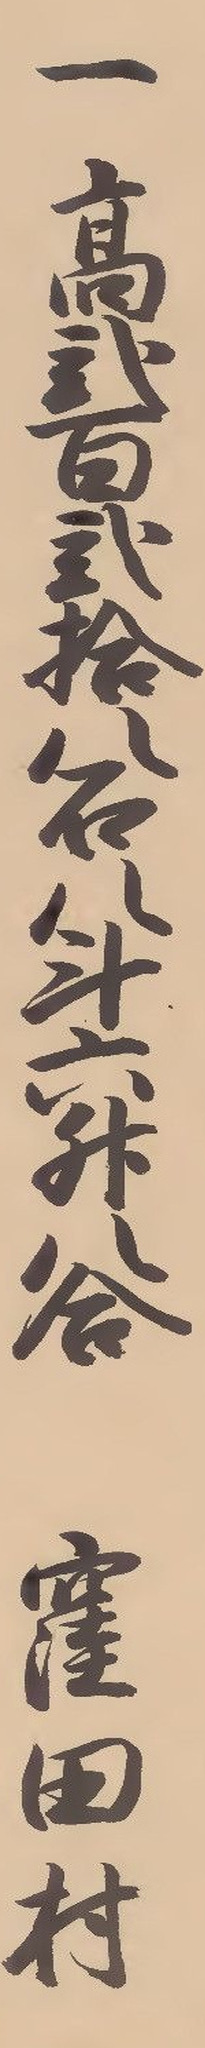一高弐百弐拾八石八斗六升八合窪田村
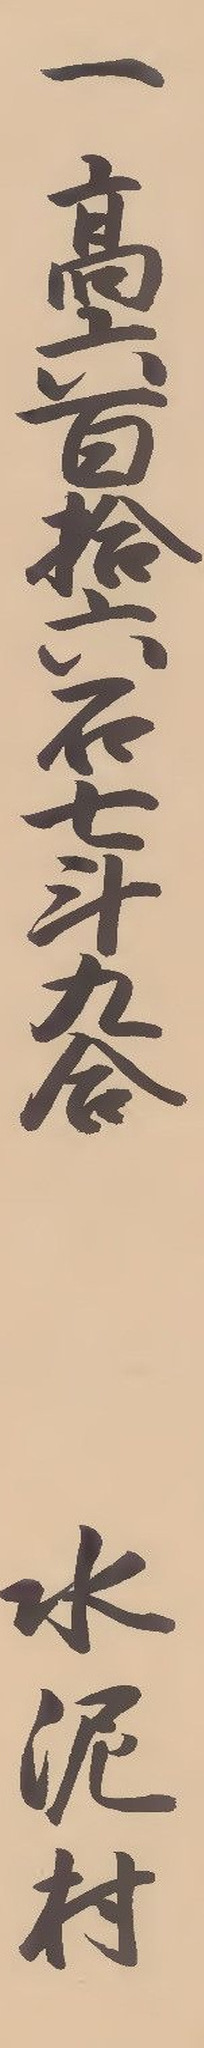一高六百拾六石七斗九合水泥村
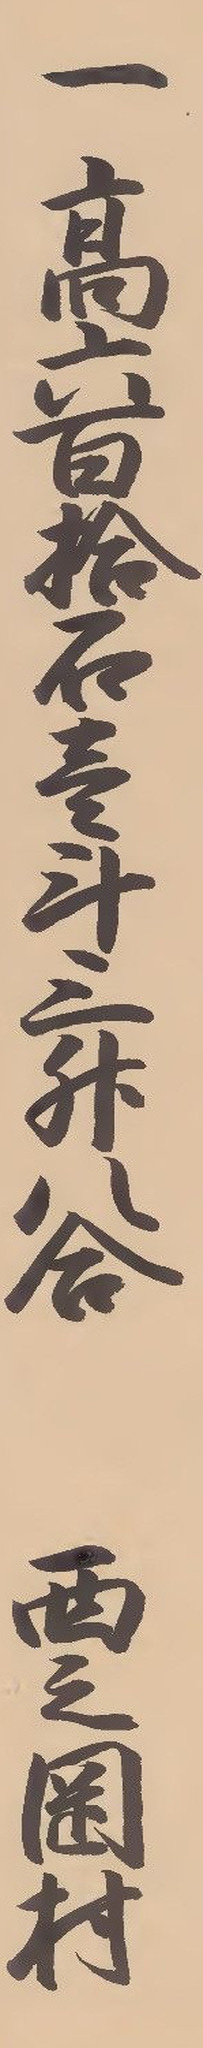一高六百拾石壱斗三升八合西之岡村
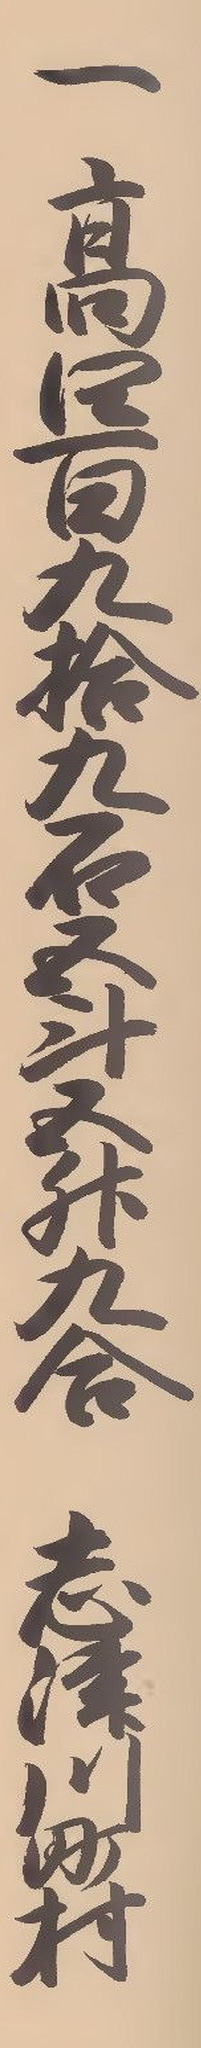一高四百九拾九石五斗五升九合志津川町村
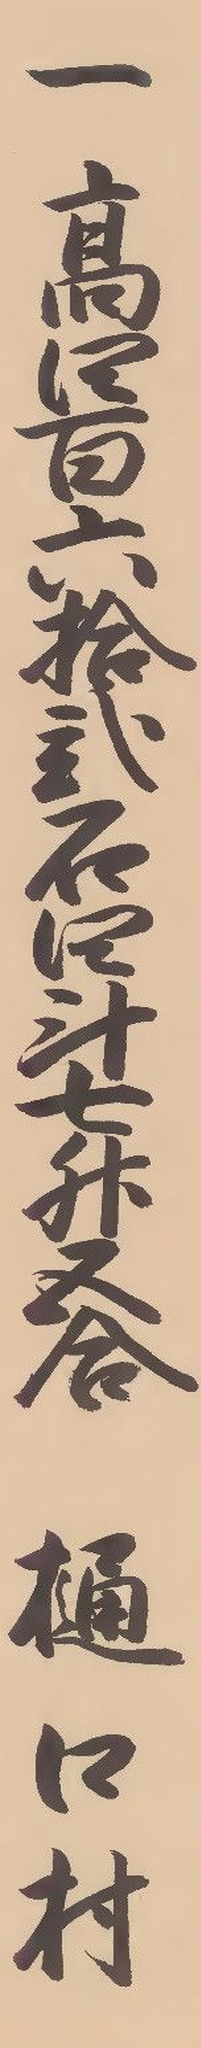一高四百六拾弐石四斗七升五合樋口村
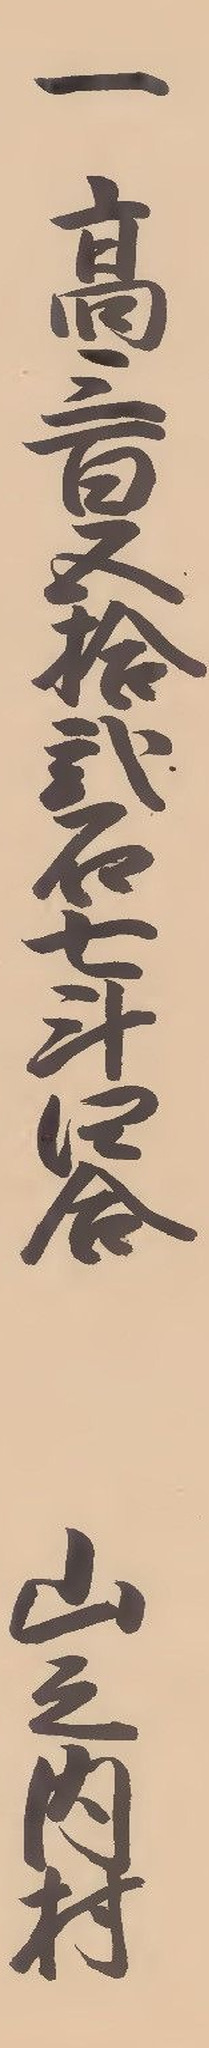一高三百五拾弐石七斗四合山之内村
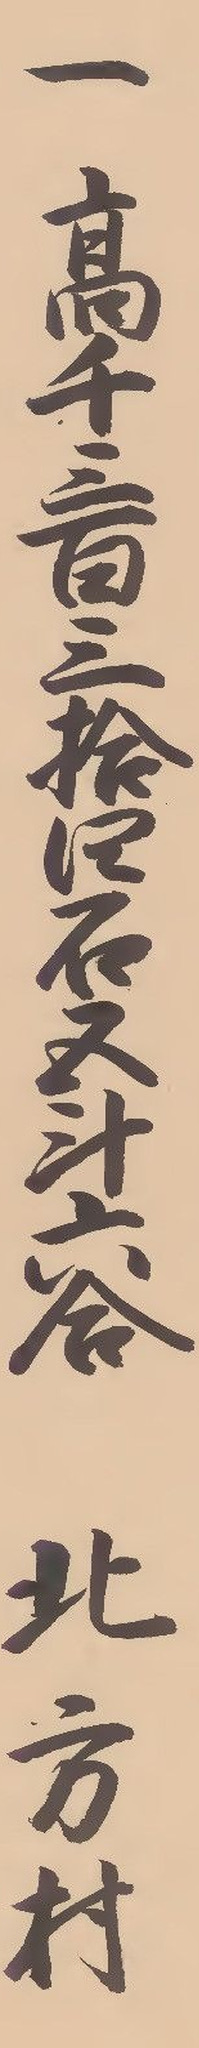一高千三百三拾四石五斗六合北方村

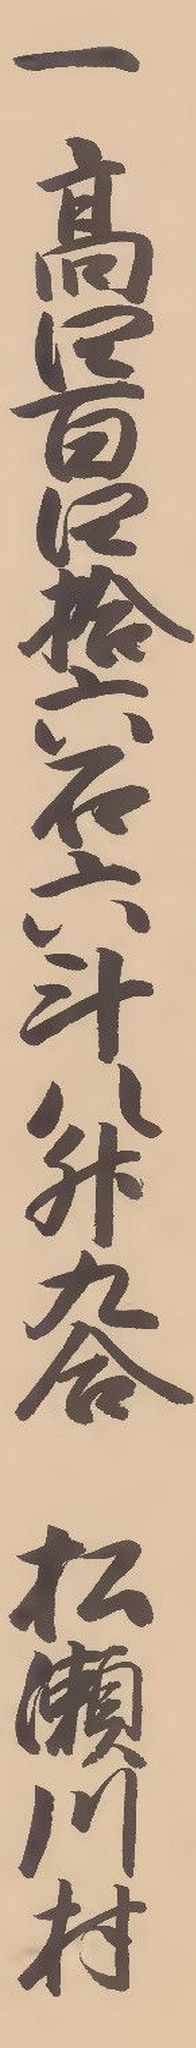一高四百四拾六石六斗八升九合松瀬川村
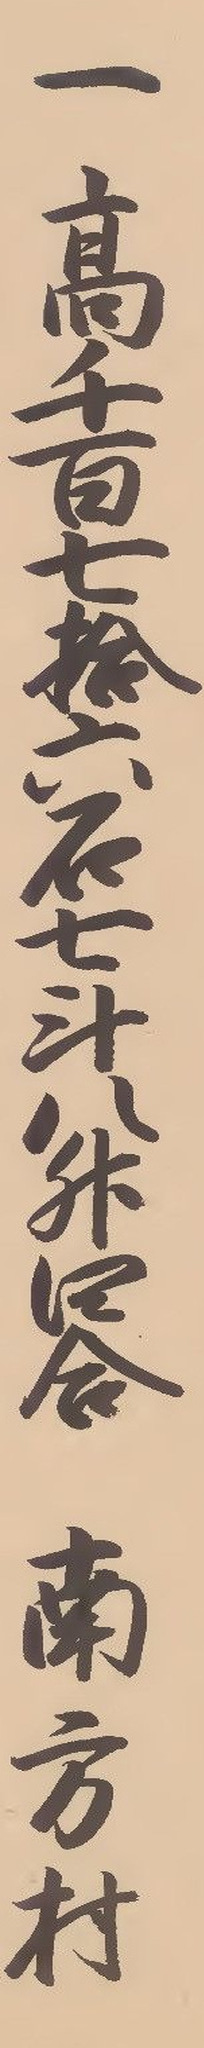一高千百七拾六石七斗八升四合南方村
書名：伊予国郷帳
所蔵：国立公文書館 National Archives of Japan
